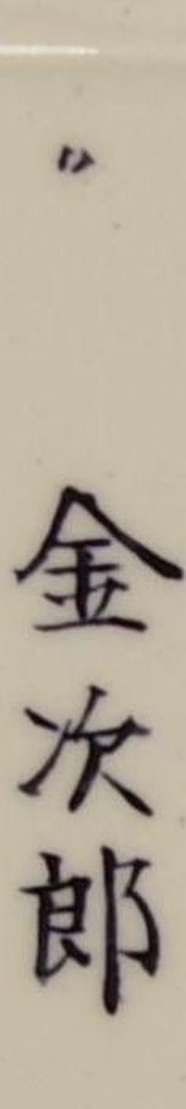金次郎
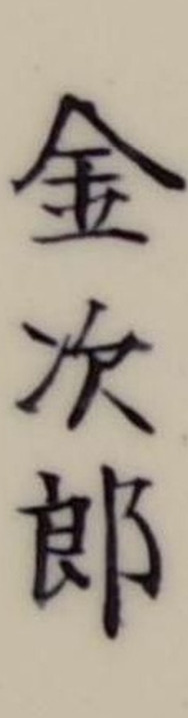金次郎
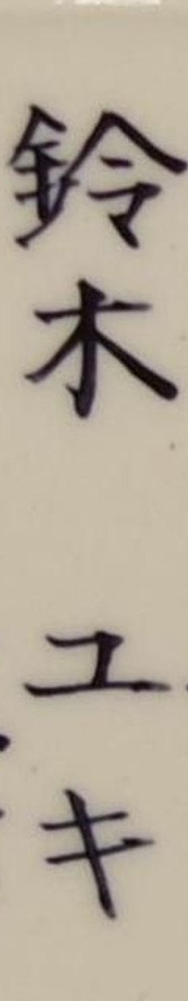鈴木ユキ
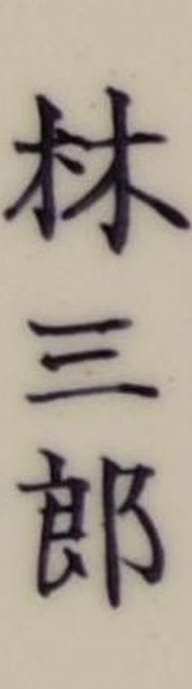林三郎
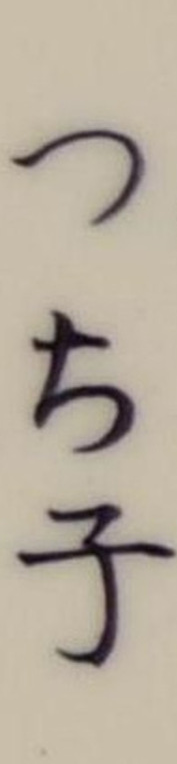つち子
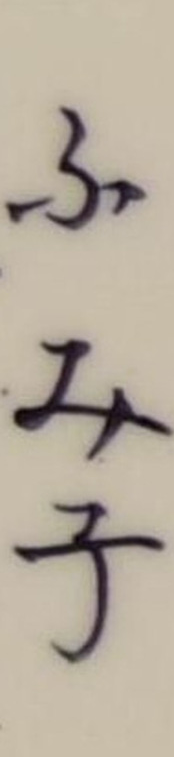ふみ子
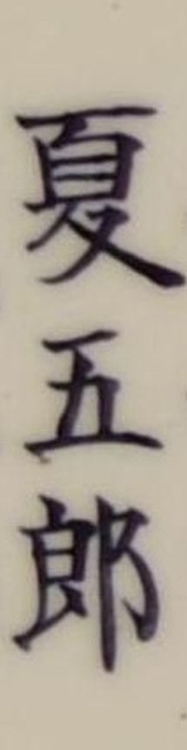夏五郎
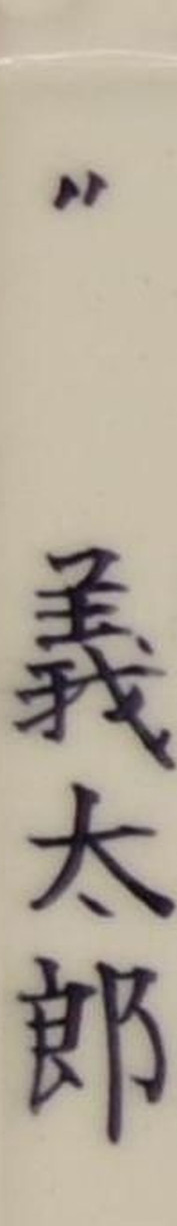義太郎
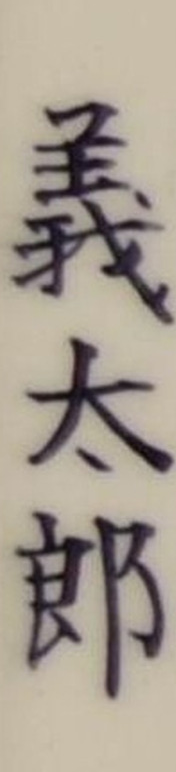義太郎

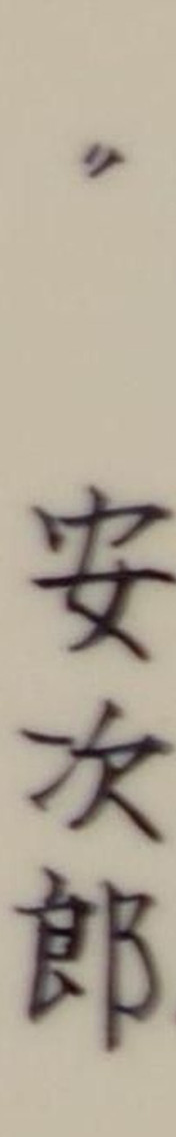安次郎
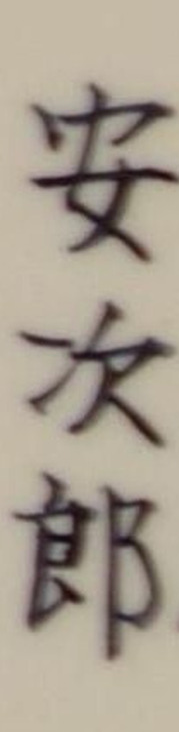安次郎
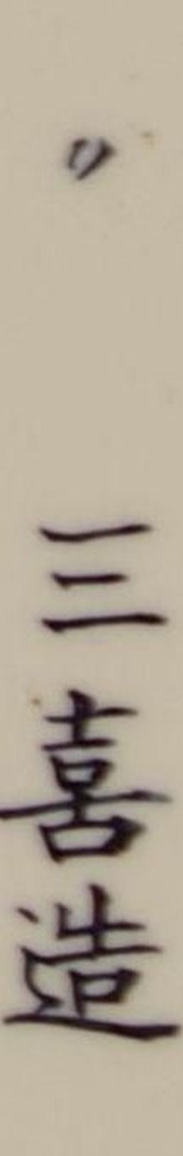三喜造
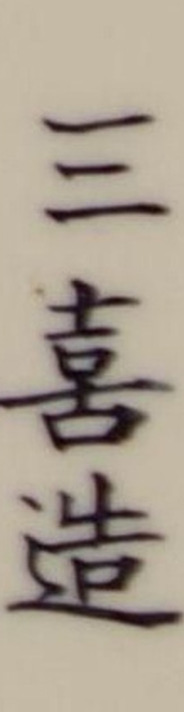三喜造
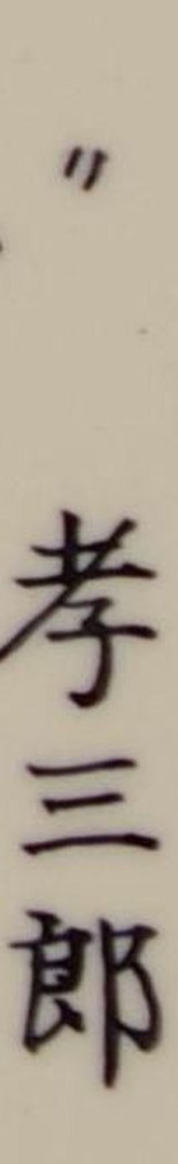孝三郎
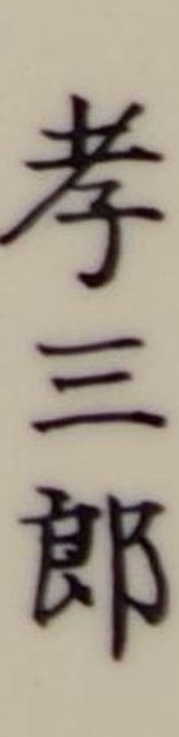孝三郎
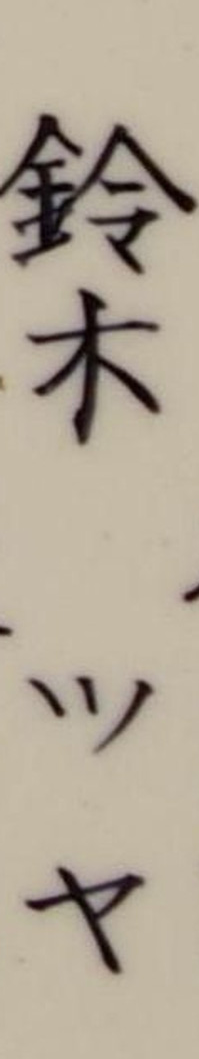鈴木ツヤ
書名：M~S
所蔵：高野山金剛峯寺
